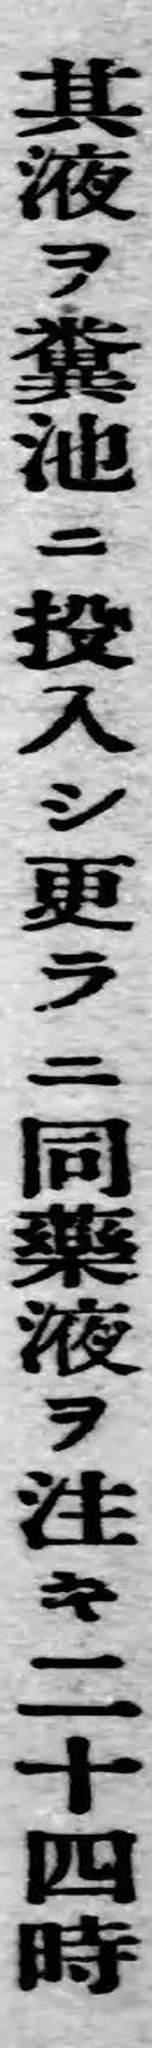其液ヲ糞池ニ投入シ更ラニ同藥液ヲ注キ二十四時
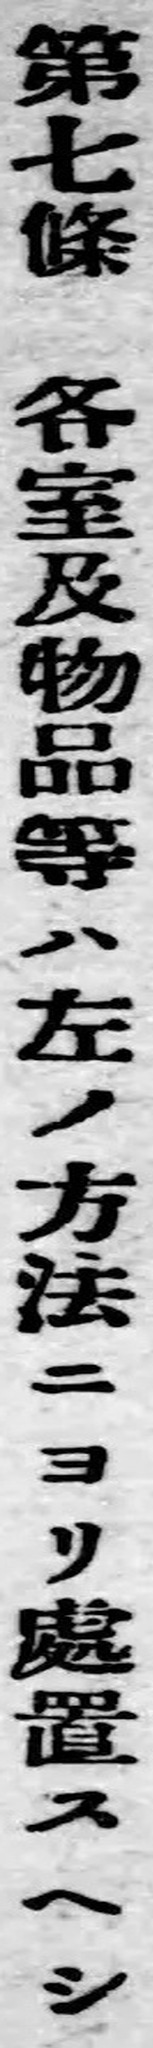第七條各室及物品等ハ左ノ方法ニヨリ處置スヘシ
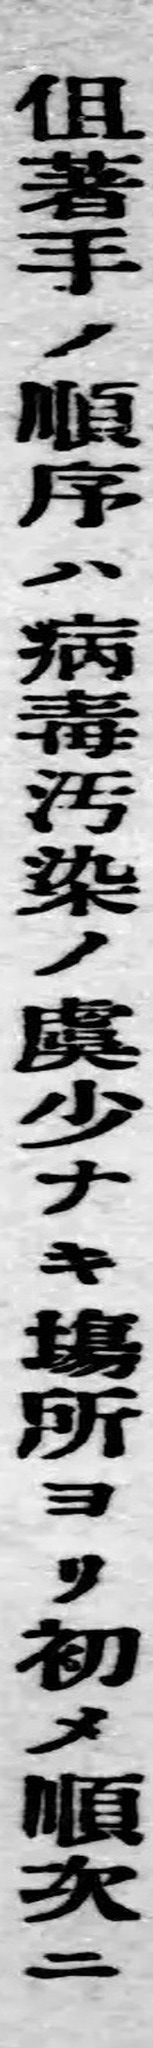但著手ノ順序ハ病毒汚染ノ虞少ナキ塲所ヨリ初メ順次ニ
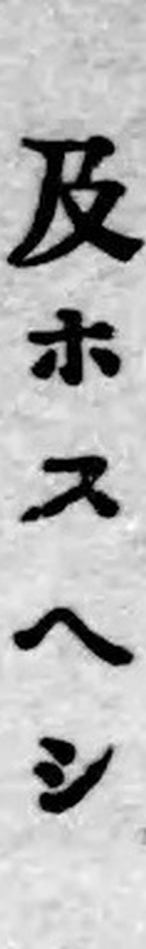及ホスヘシ
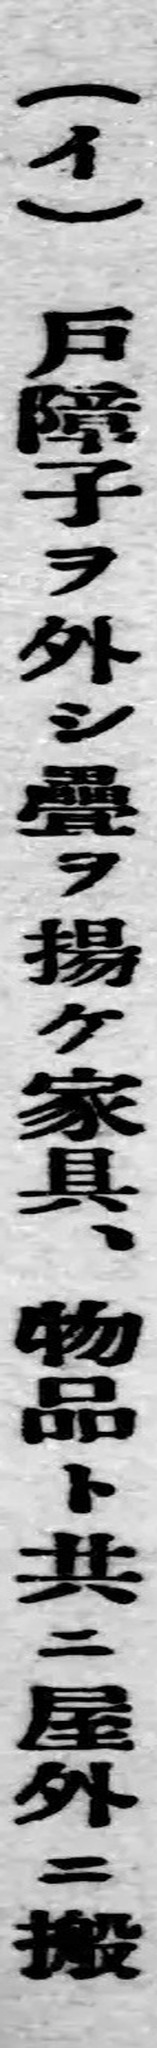(イ)戸障子ヲ外シ疊ヲ揚ケ家具、物品ト共ニ屋外ニ搬
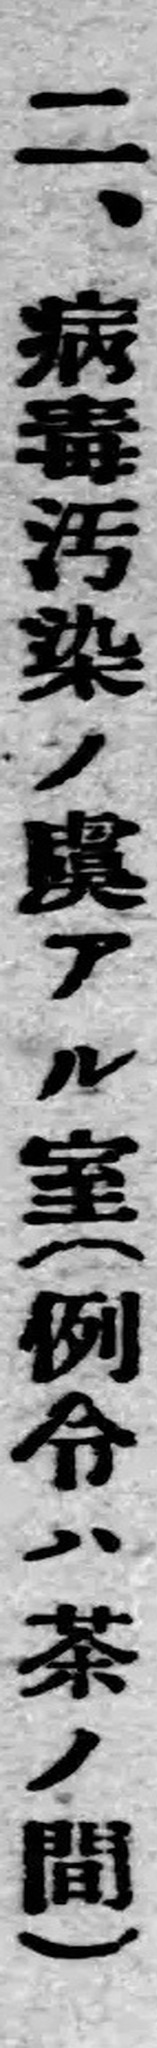二、病毒汚染ノ虞アル室(例令ハ茶ノ間)

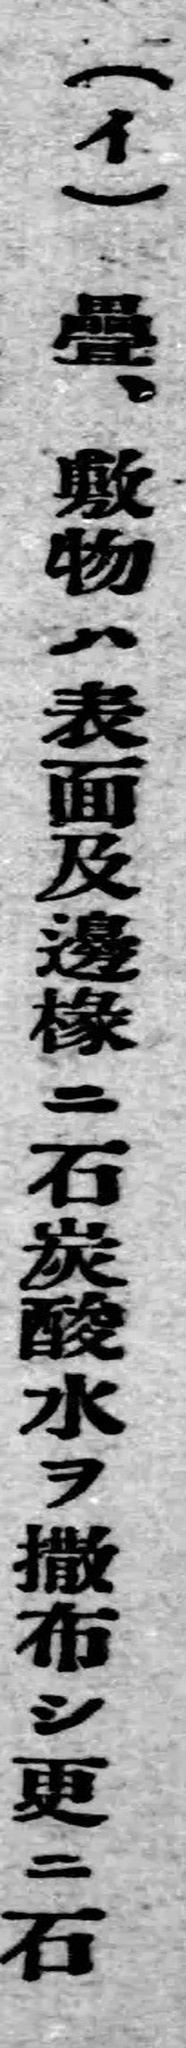(イ)疊、敷物ハ表面及邊椽ニ石炭酸水ヲ撒布シ更ニ石
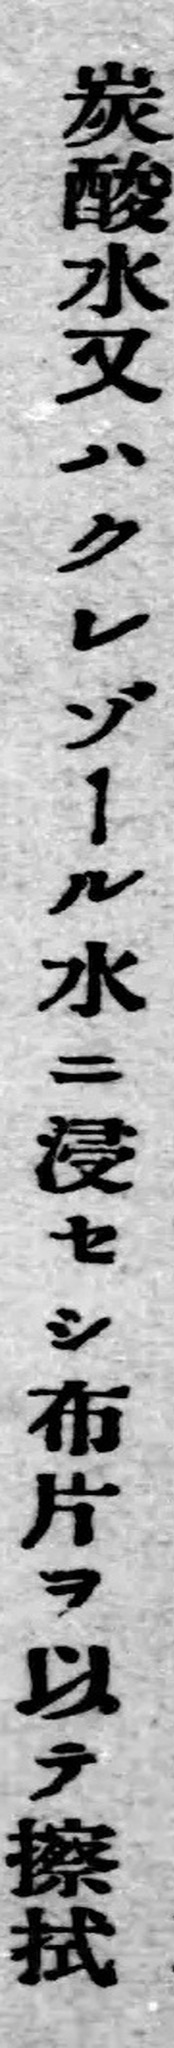炭酸水又ハクレゾール水ニ浸セシ布片ヲ以テ擦拭
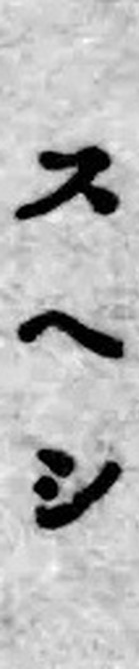スヘシ
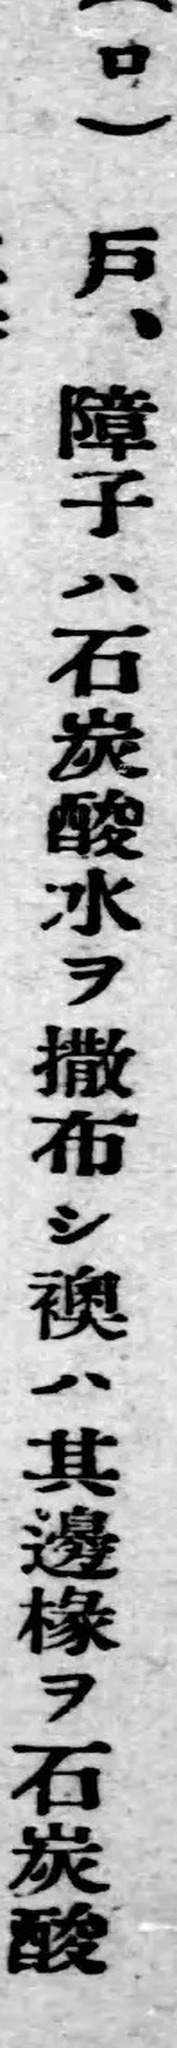(ロ)戸、障子ハ石炭酸水ヲ撒布シ襖ハソノ邊椽ヲ石炭酸
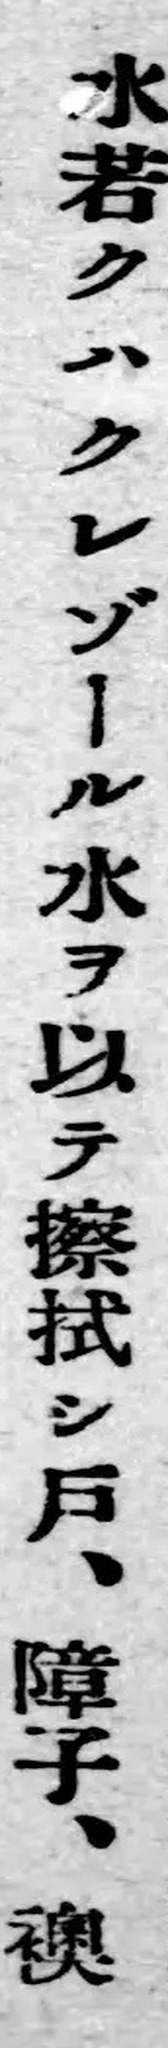水若クハクレゾール水ヲ以テ擦拭シ戸、障子、襖
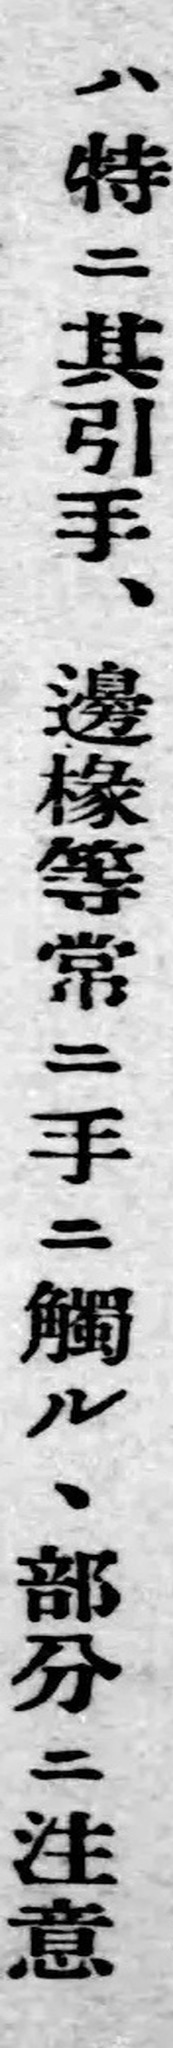ハ特ニ其引手、邊椽等常ニ手ニ觸ルヽ部分ニ注意
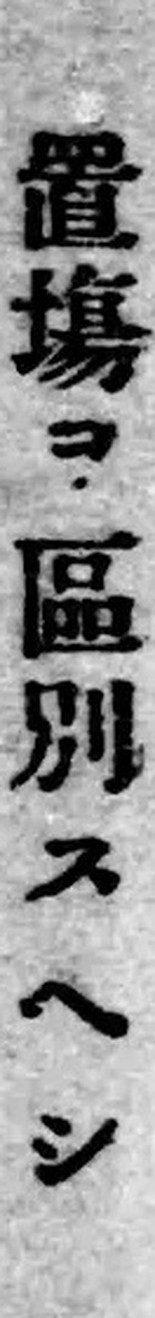置塲ヲ區別スヘシ
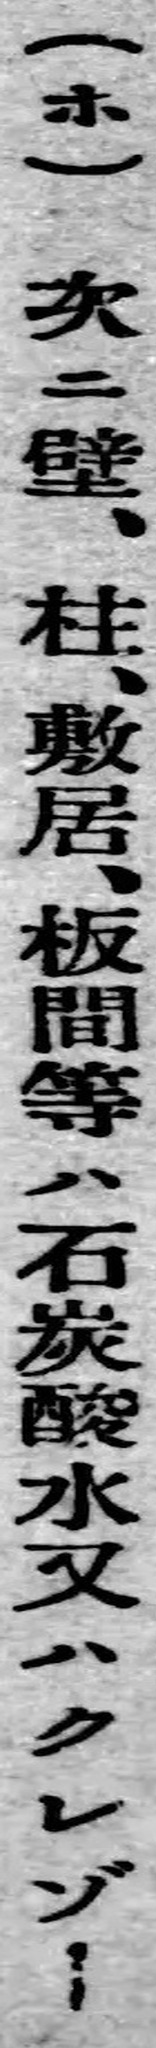(ホ)次ニ壁、柱、敷居、板間等ハ石炭酸水又ハクレゾー
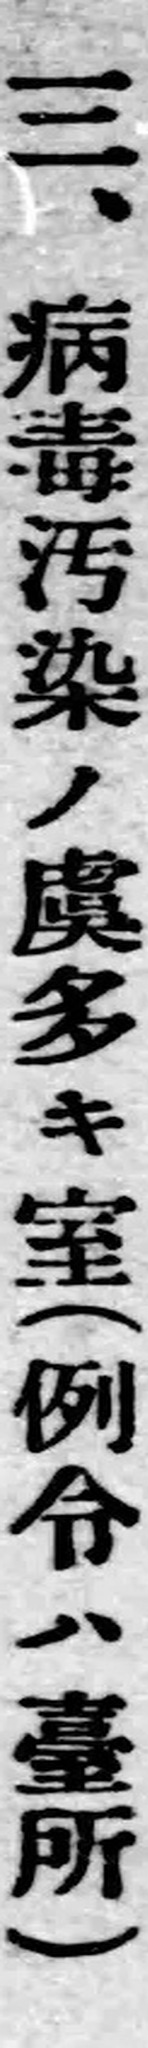三、病毒汚染ノ虞多キ室(例令ハ臺所)
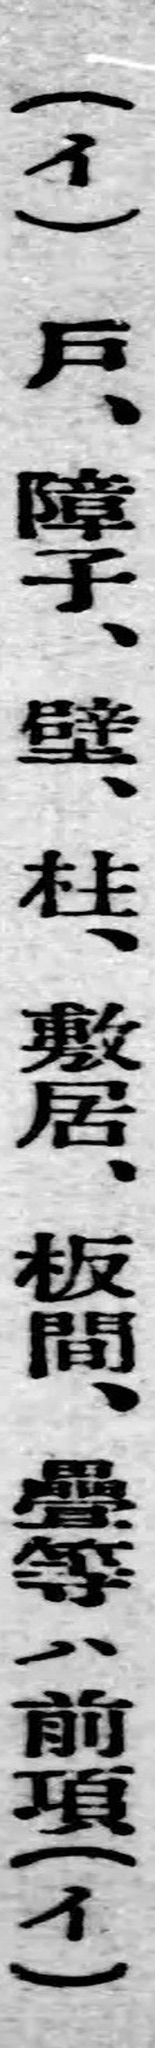(イ)戸、障子、壁、柱、敷居、疊等ハ前項(イ)
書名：袖珍防疫必携
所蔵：国立国会図書館 National Diet Library, JAPAN
